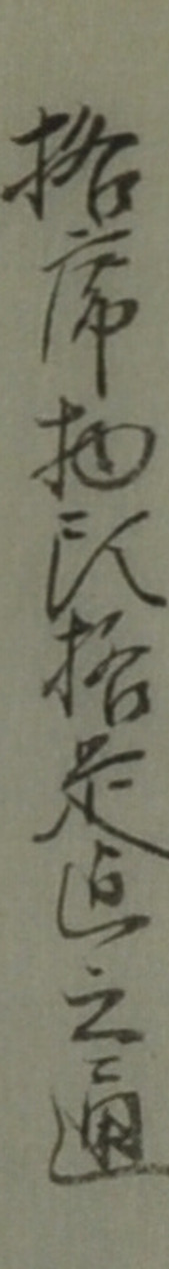格席物頭格是迄之通
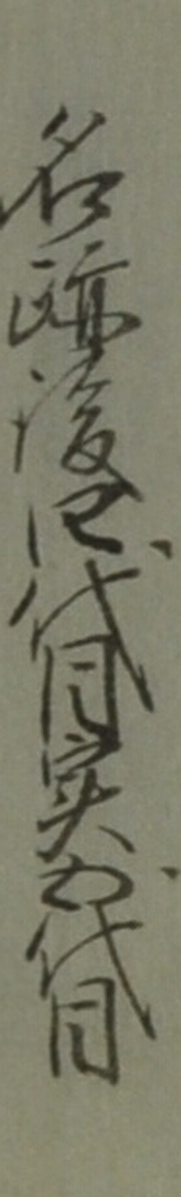名跡後四代目実五代目
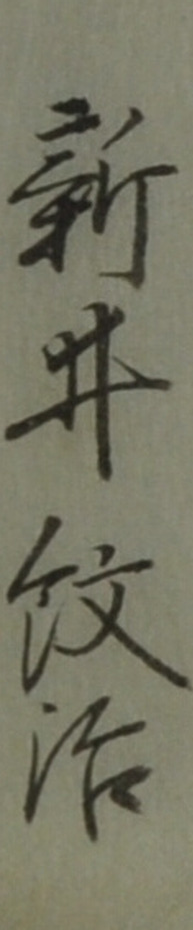新井紋治
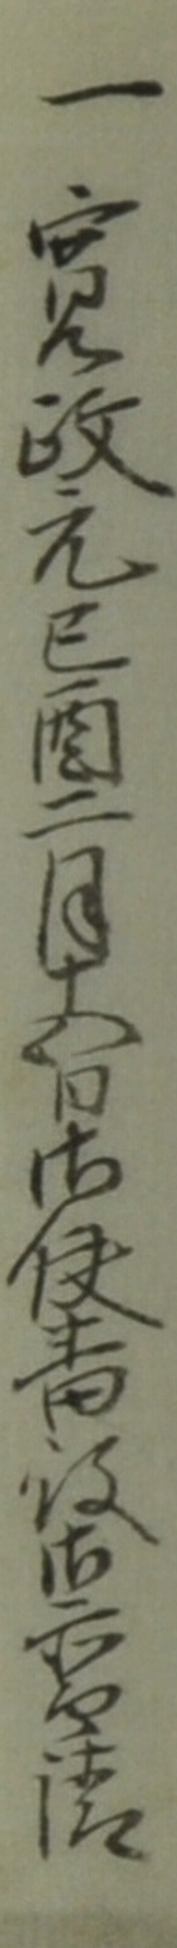一寛政元己酉二月十五日御使番役御普請

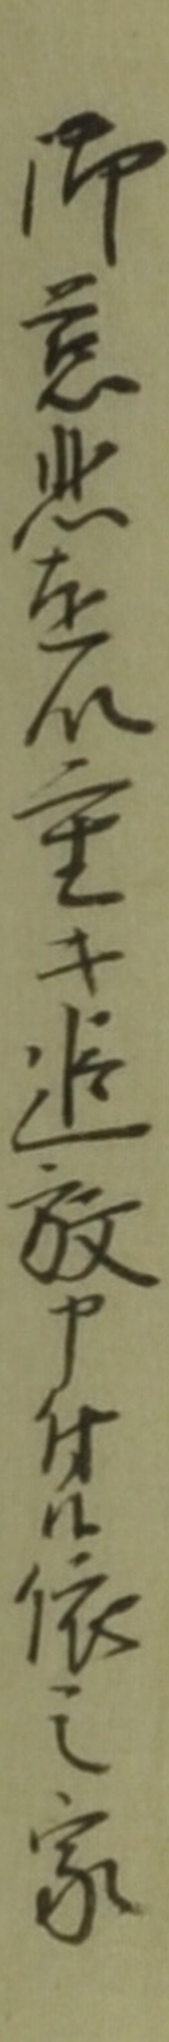御慈悲を以重キ追放申付候依之家
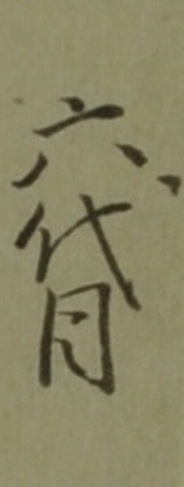六代目
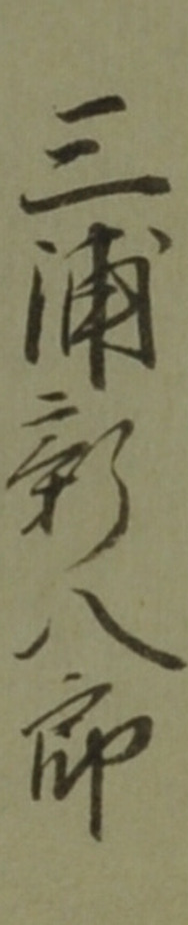三浦新八郎
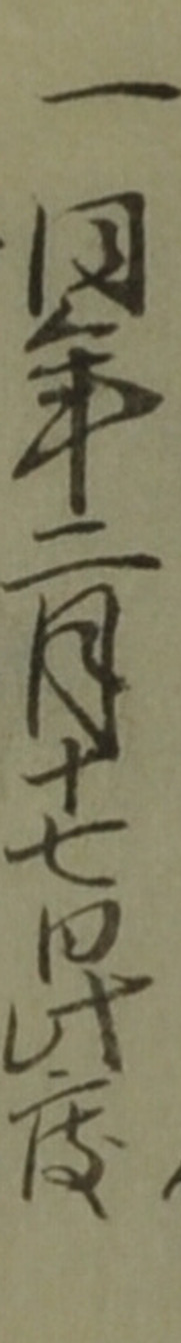一同年二月十七日此度
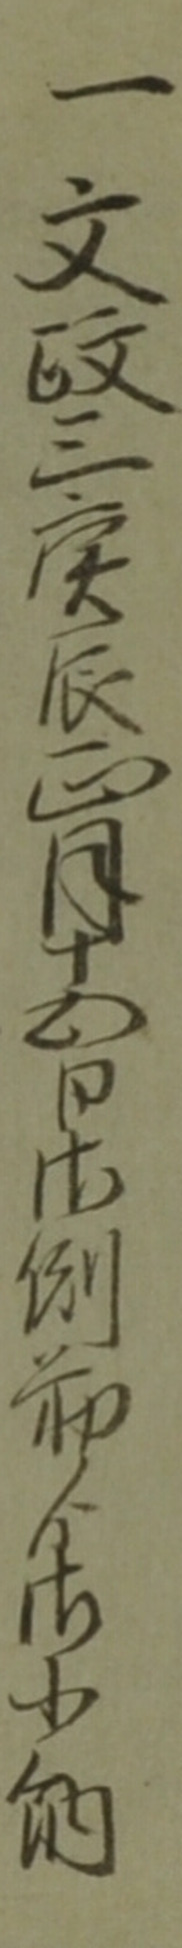一文政三庚辰正月十五日御側勤ゟ御小納
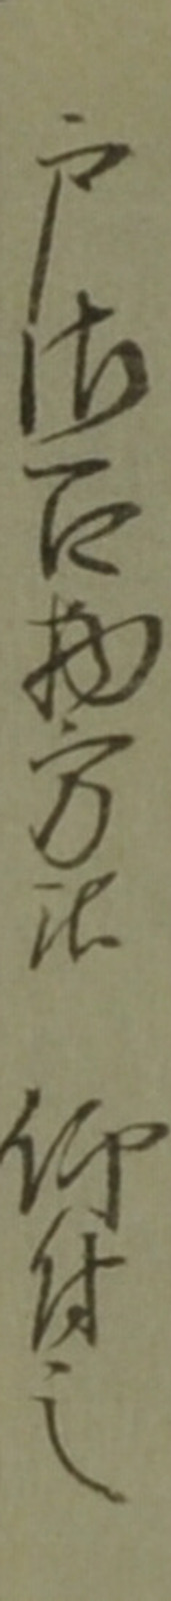戸御召物方被仰付之
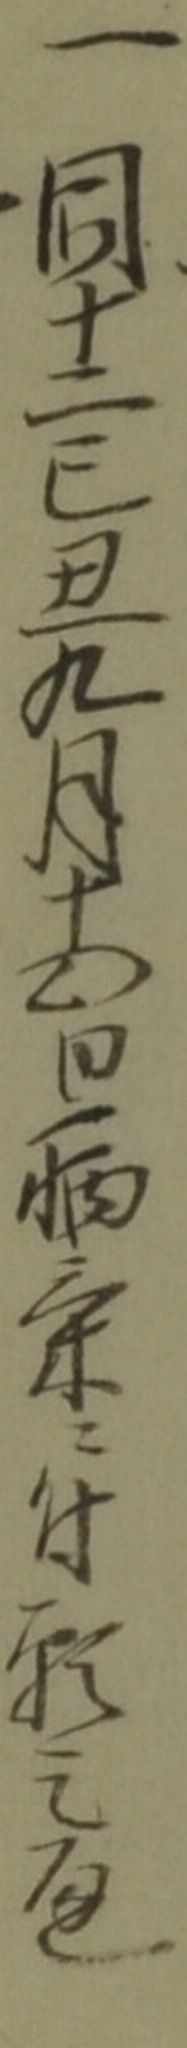一同十二己丑九月十五日病気ニ付願之通
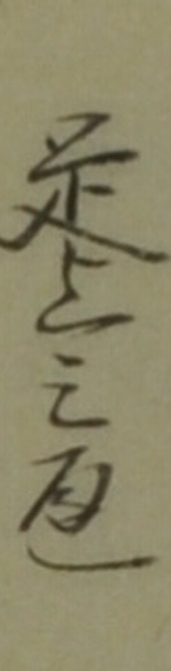是迄之通
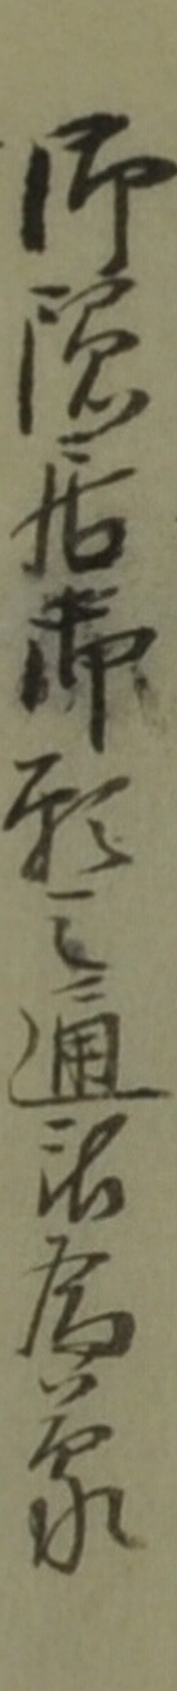御隠居御願之通被為蒙
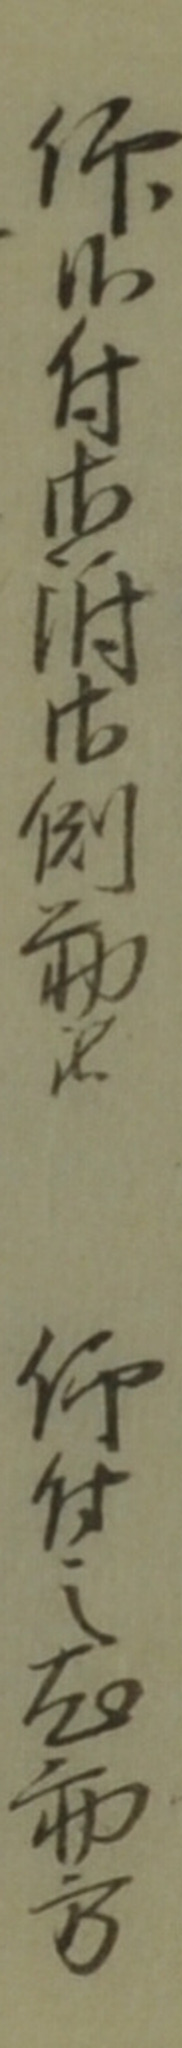仰候付御附御側勤被仰付之尤勤方
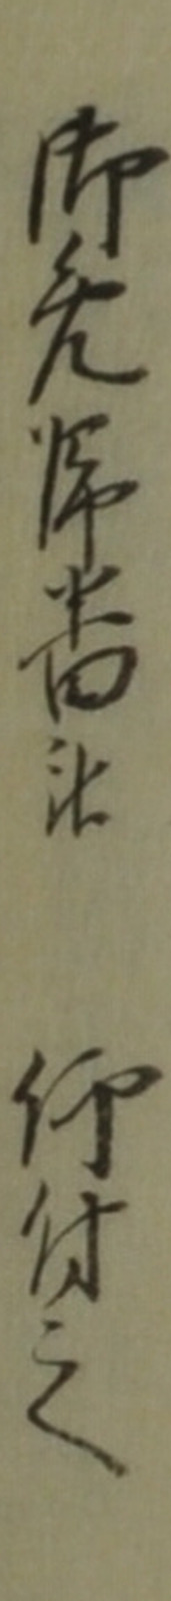御免帰番被仰付之
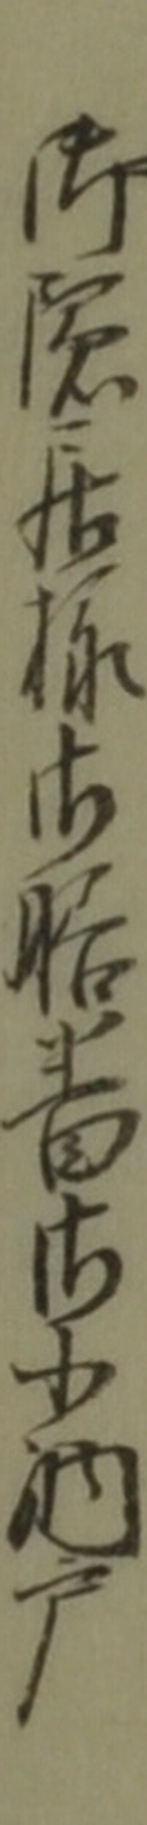御隠居様御膳番御小納戸
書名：諸御役代々録（四）
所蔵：伊那市立高遠町図書館・合同会社AMANE
